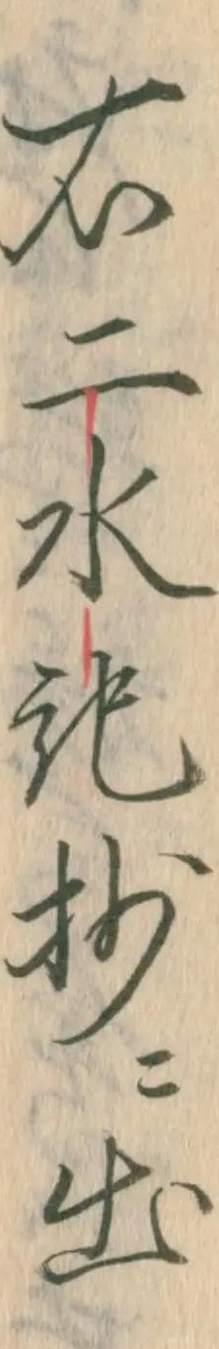右二-水-記抄ニ出
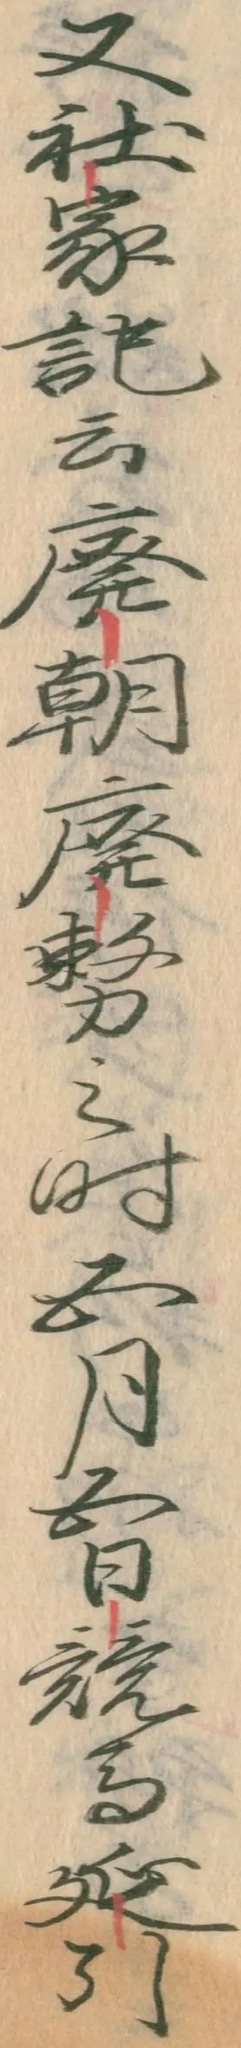又社-家記云廃-朝廃-務之時五月五日-競馬延-引
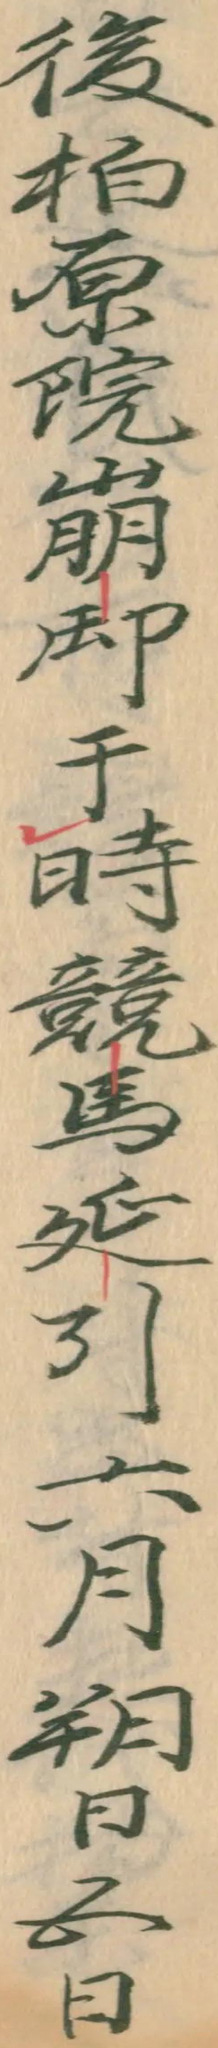後柏原院崩-御于時競-馬延-引六月朔日五日
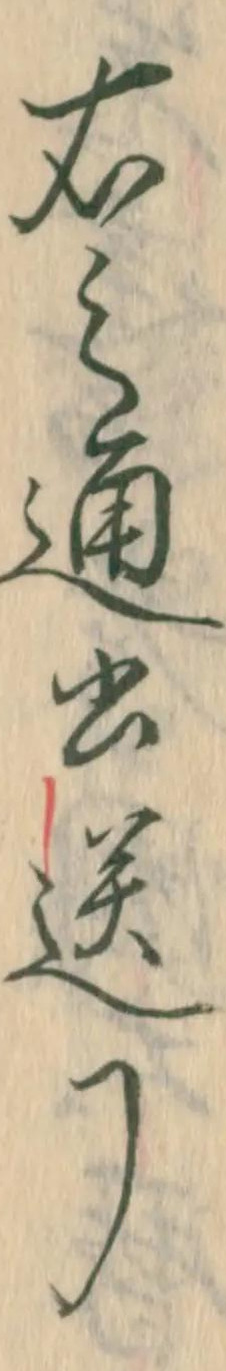右之通書_送コト

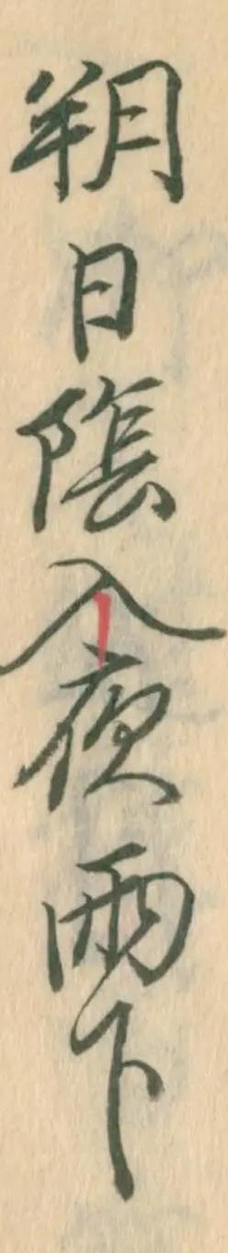朔日陰入-夜雨下
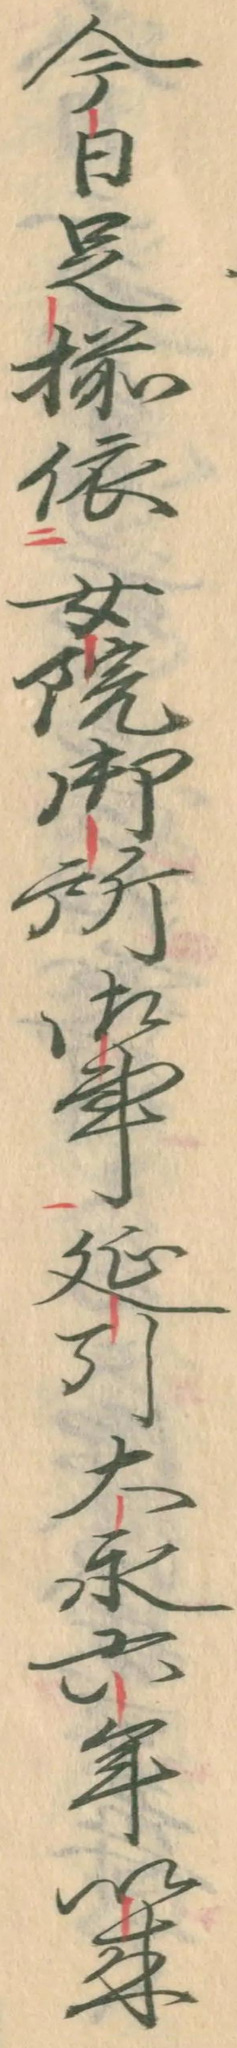今-日足_揃依女-院御-所御-事延-引大-永六-年以-来
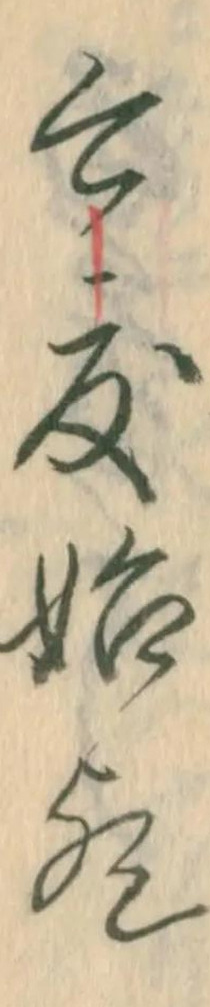今-度始歟
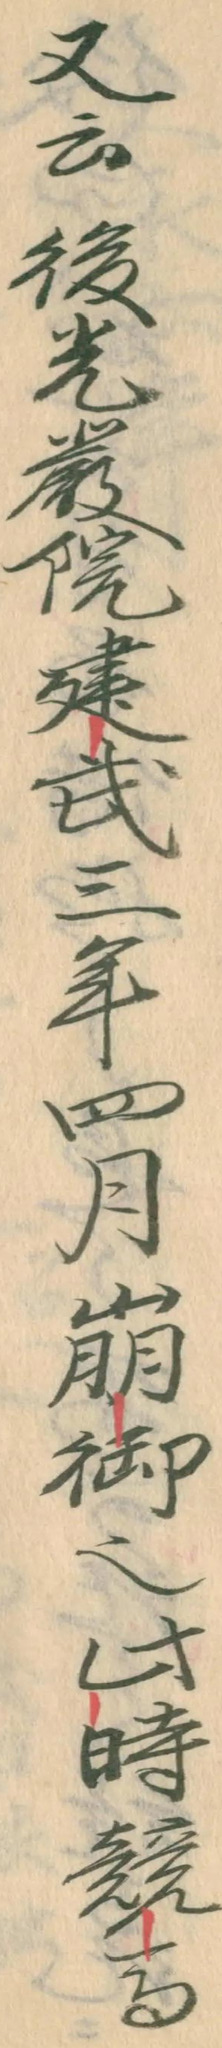又云後光厳院建-武三年四月崩-御也此_時競-馬
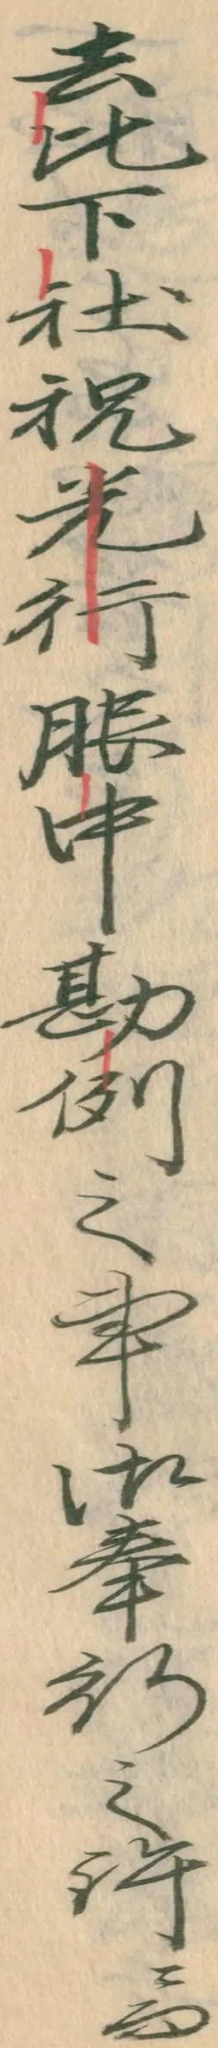去_比下_社祝光行服-中勘-例之事御奉行之許ニ而
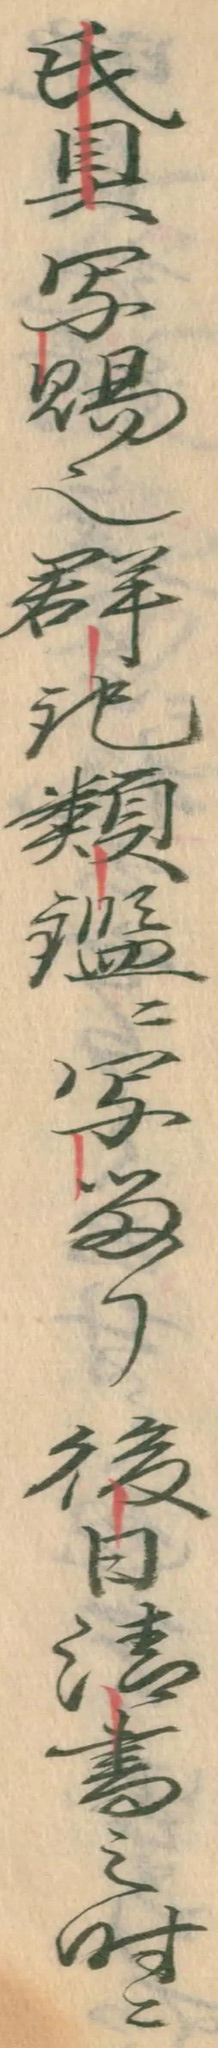氏具写_賜也群-記類-鑑ニ写_留コト後-日清-書之時ニ
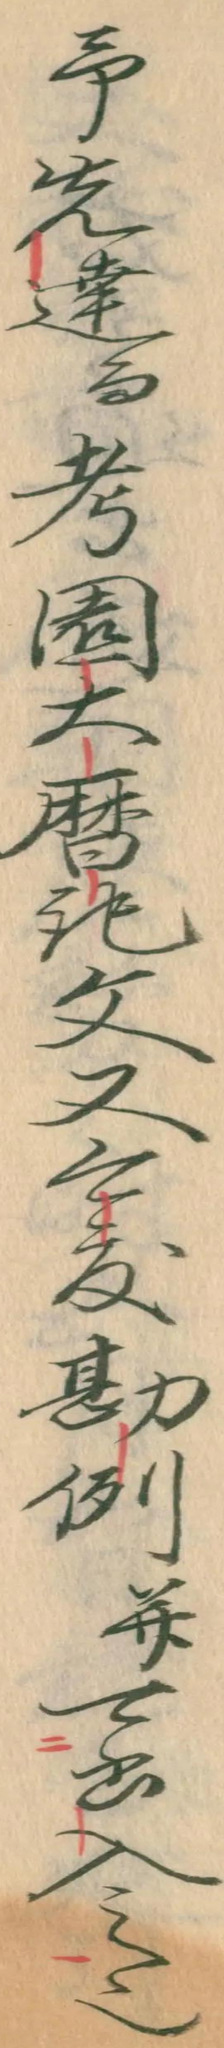予先_達而考園-大-暦-記文又今-度勘-例并可書_入之也
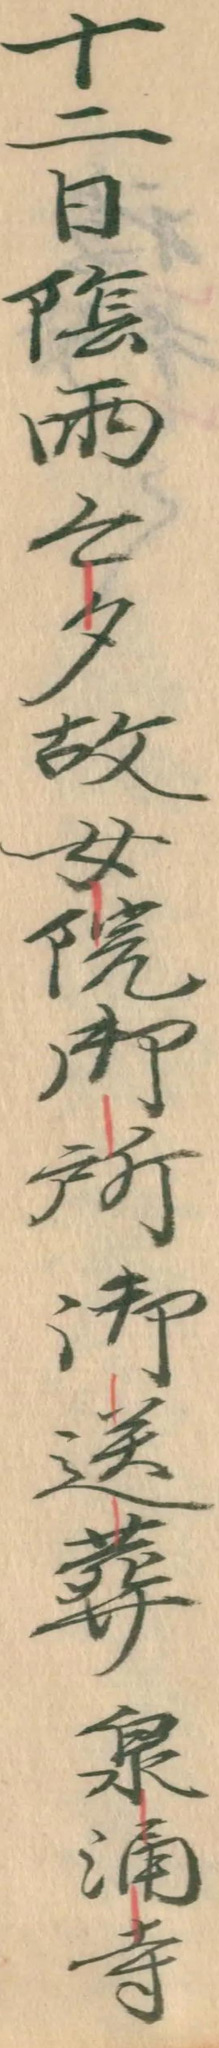十二日陰雨今-夕故女-院御-所御-送-葬泉-涌-寺
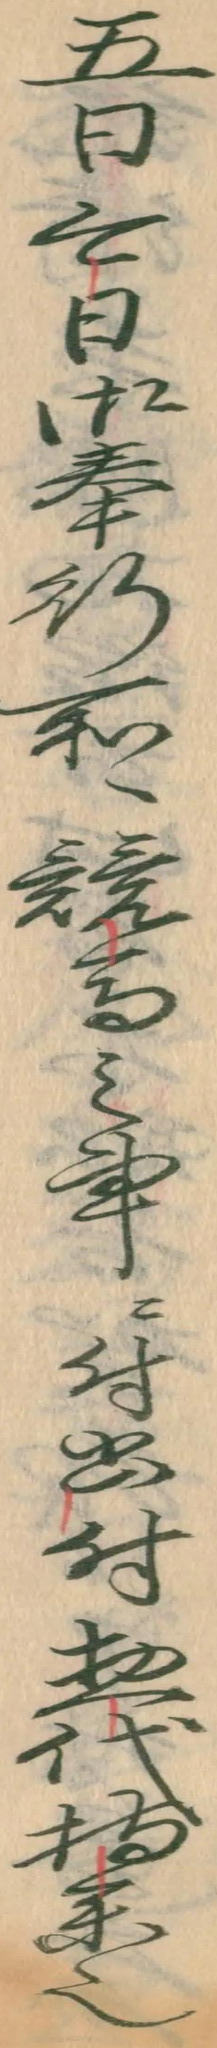五日今-日御奉行所ヘ競-馬之事ニ付書_付惣-代持-参也
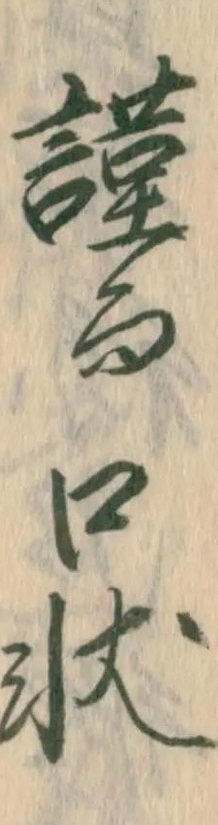謹而口状
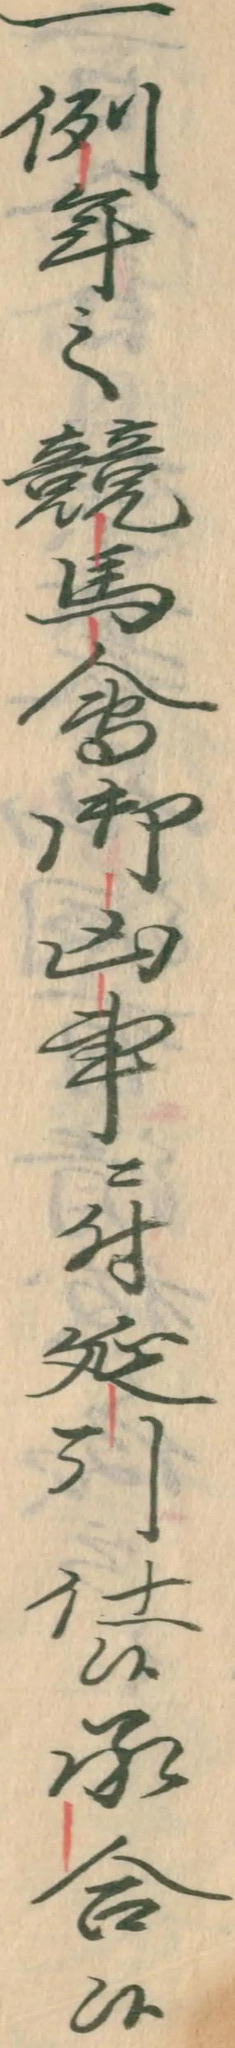一例-年之競-馬-会御-凶-事ニ付延-引仕候承_合候
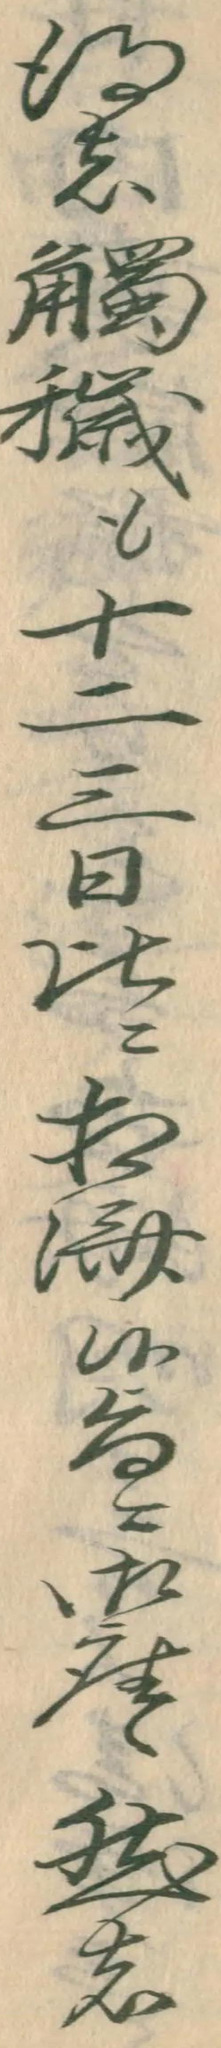得者触穢も十二三日比ニ相済候旨ニ御座候然者
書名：賀茂社記録. 第16冊
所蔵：国立国会図書館 National Diet Library, JAPAN
